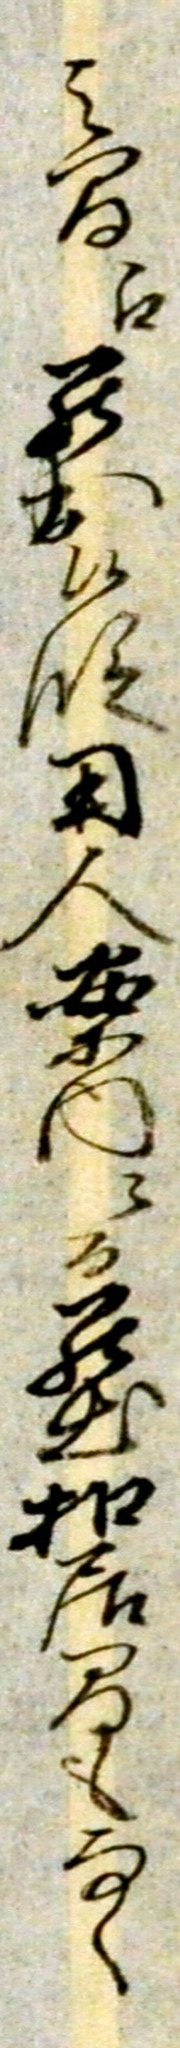之間江罷出候段用人案内ニ而罷出扣居間もなく
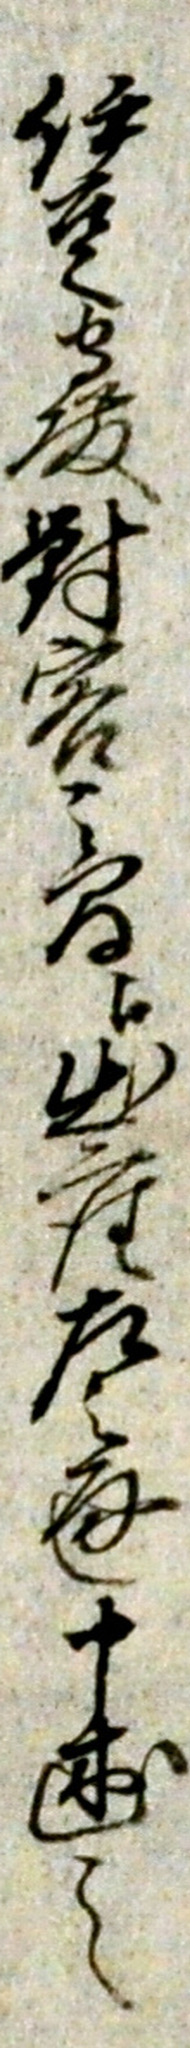伊豆守殿対客之間江出座左之通申述之
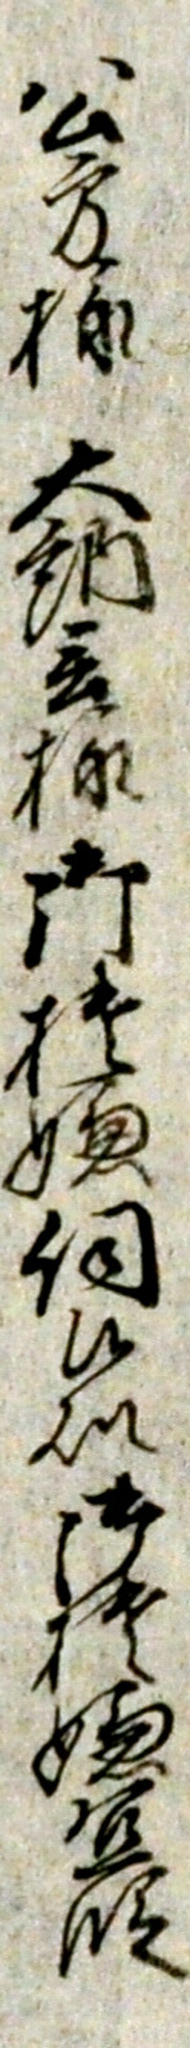公方様大納言様御機嫌伺候処御機嫌宜段
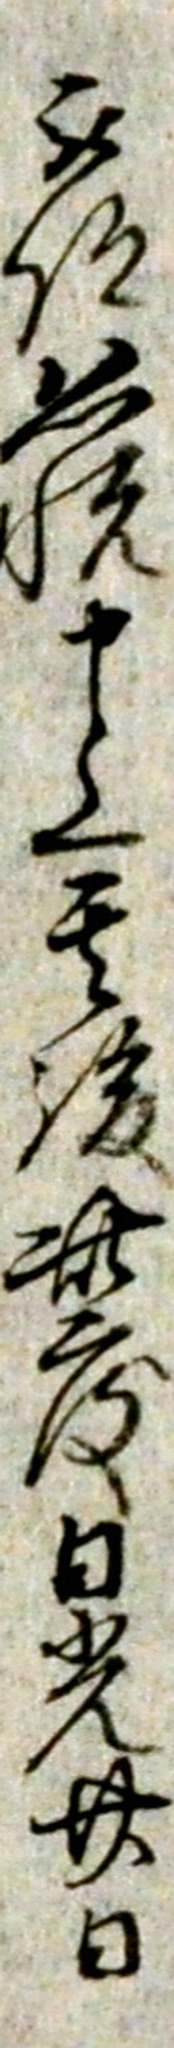被仰恐悦申上其後此度日光廿日
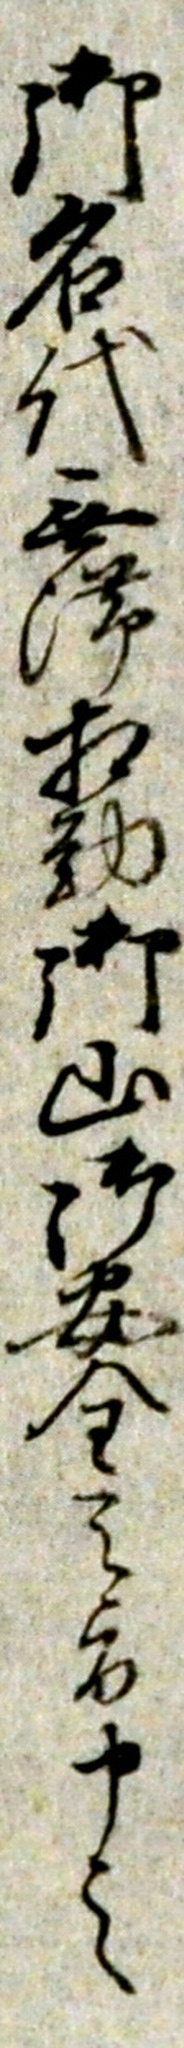御名代無滞相勤御山御安全之旨申之
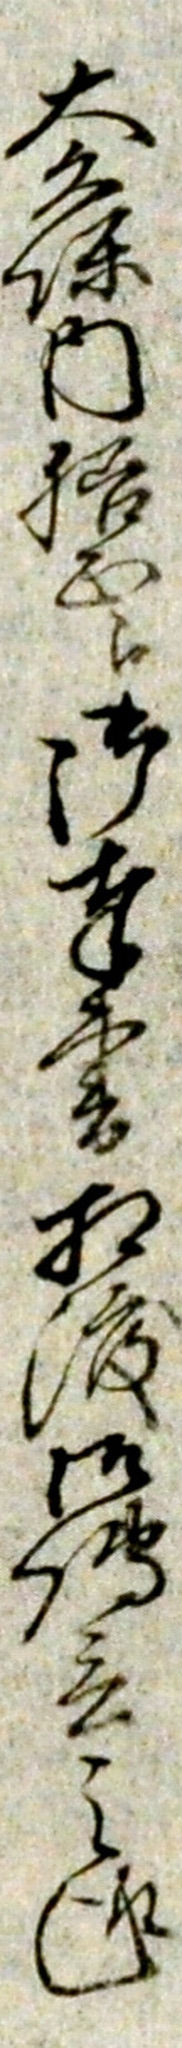大久保内膳正江御奉書相渡御伝言之趣
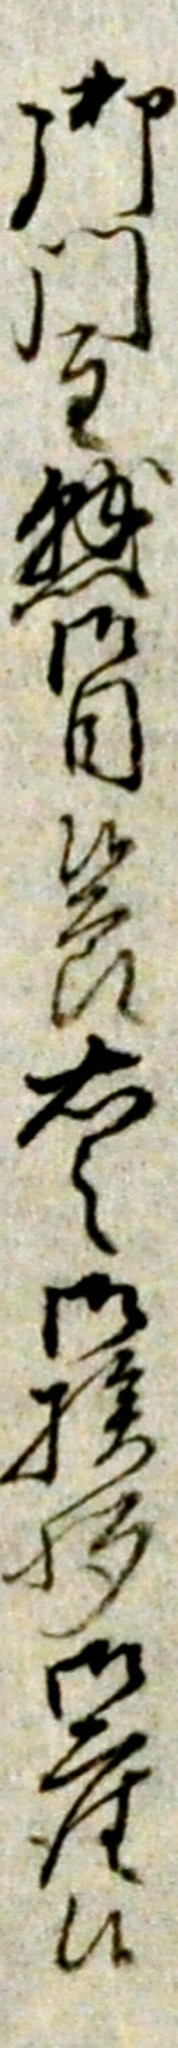御門主懸御目候節右之御挨拶御座候
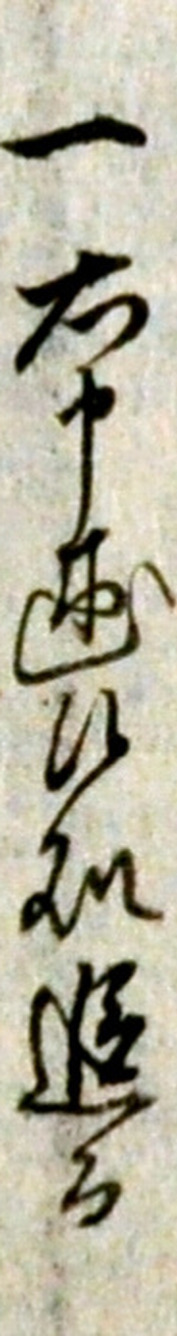一右申述候処追而
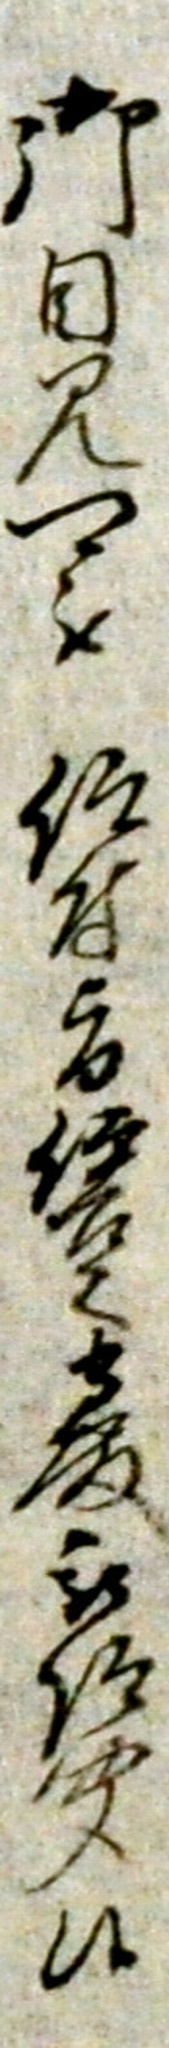御目見可被仰付旨伊豆守殿被仰聞候
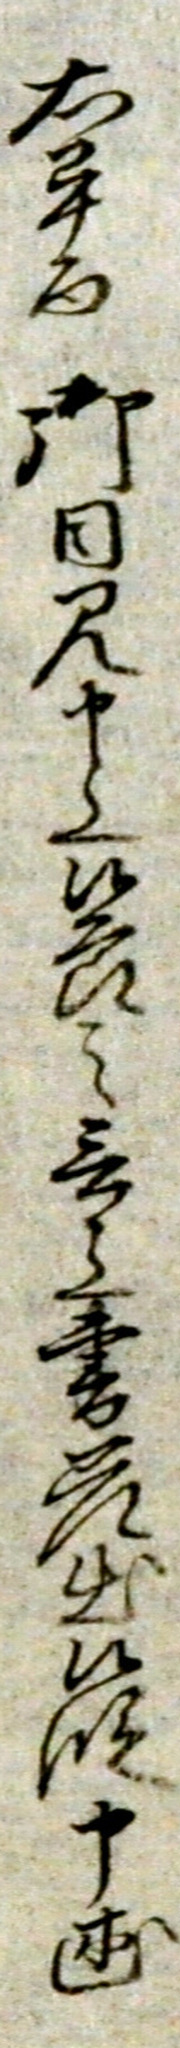右畢而御目見申上候節之言上書差出候段申述
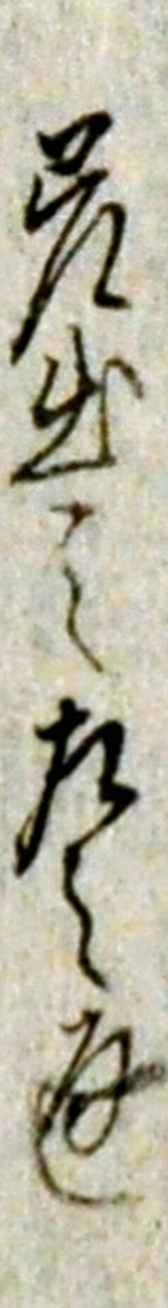差出之左之通
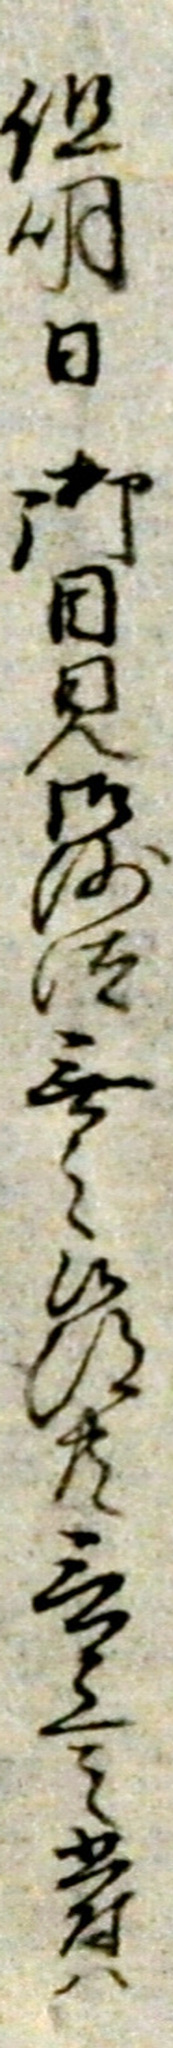但明日御目見御沙汰無之候得共言上之書付ハ
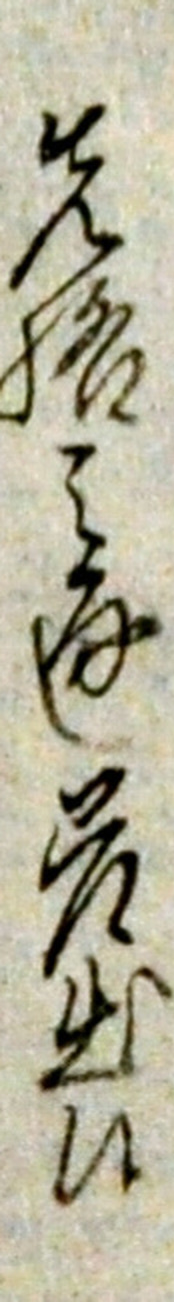先格之通差出候

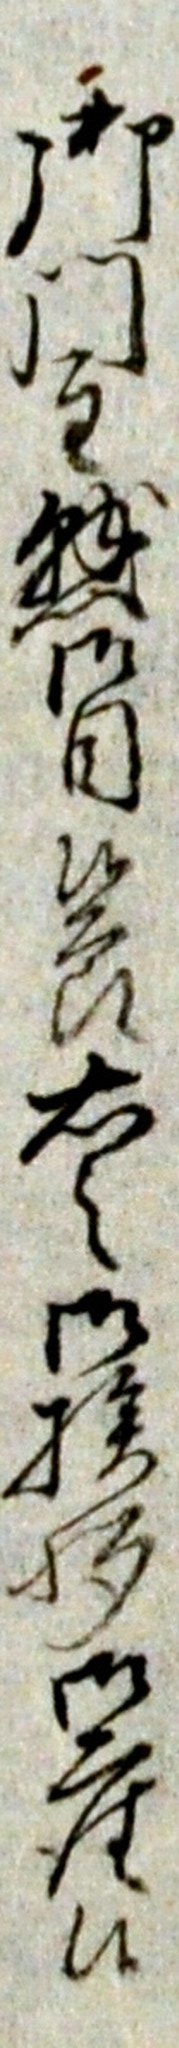御門主懸御目候節右之御挨御座候
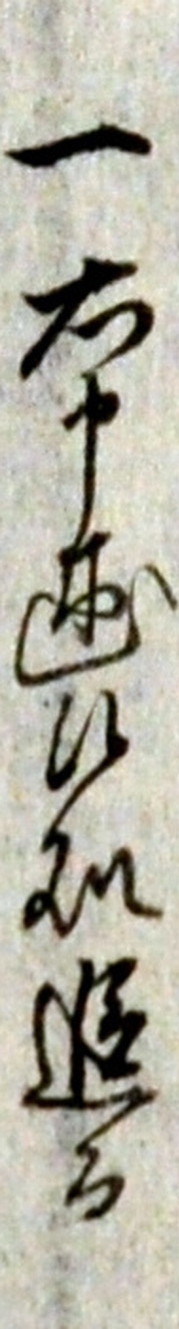一右申述候処追而
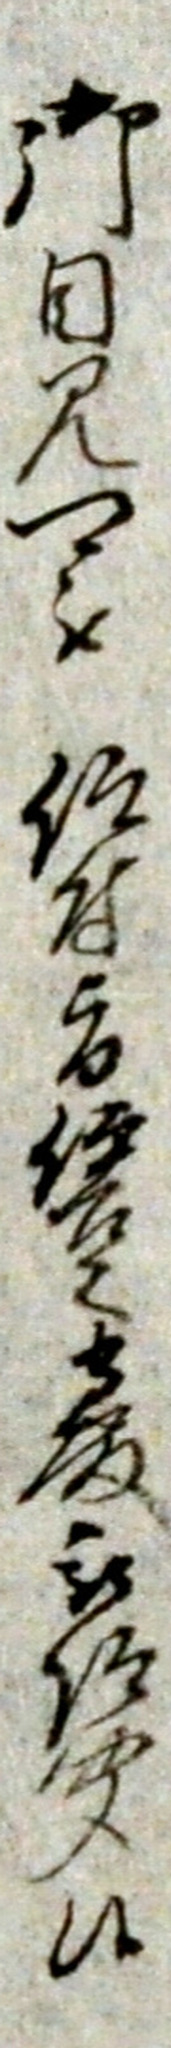御目見可被仰付旨伊豆守殿被仰聞候
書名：日光御名代相勤候節ノ留
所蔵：伊那市立高遠町図書館・合同会社AMANE
